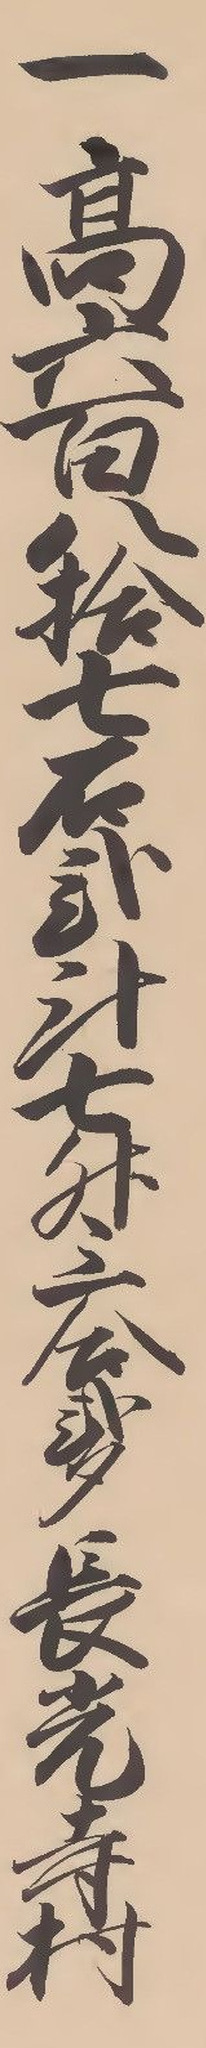一高六百八拾七石弐斗七升三合弐勺長光寺村
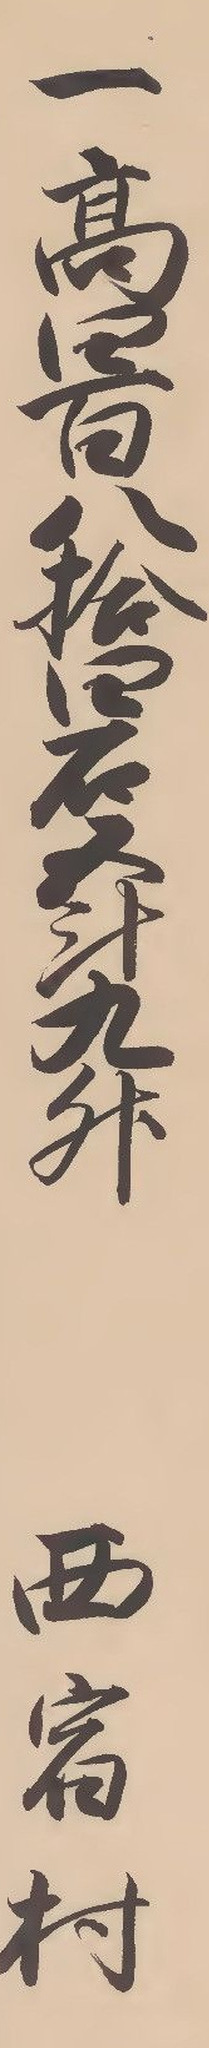一高四百八拾四石五斗九升西宿村
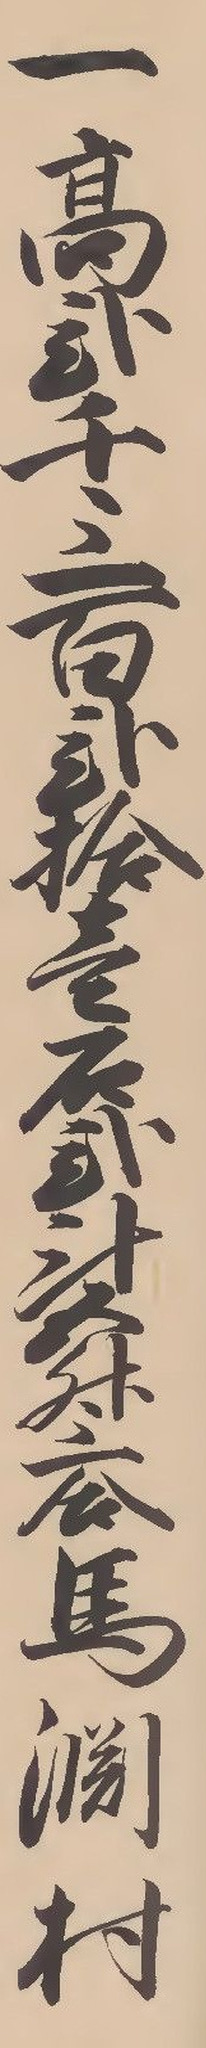一高弐千三百弐拾壱石弐斗五升三合馬淵村
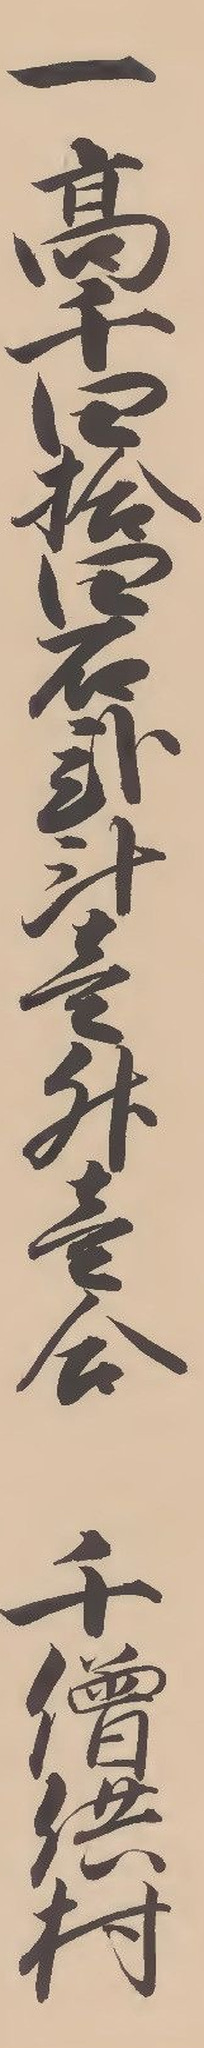一高千四拾四石弐斗壱升壱合千僧供村
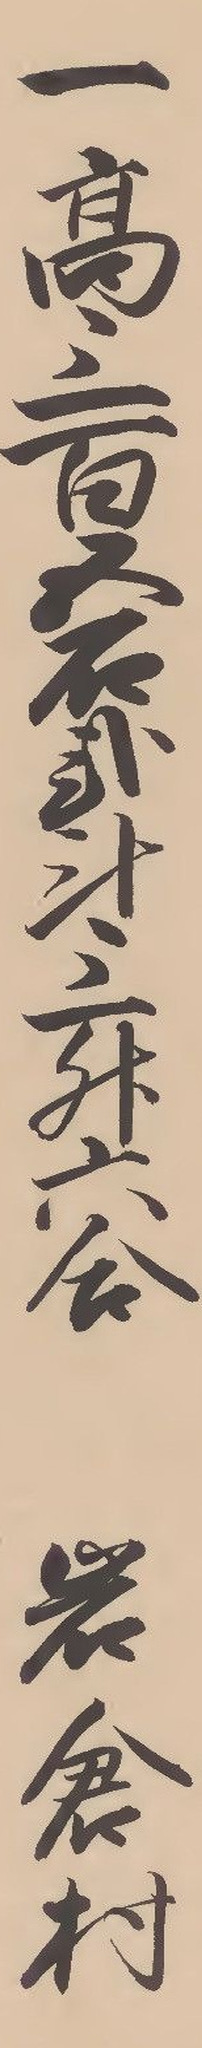一高三百五石弐斗三升六合岩倉村
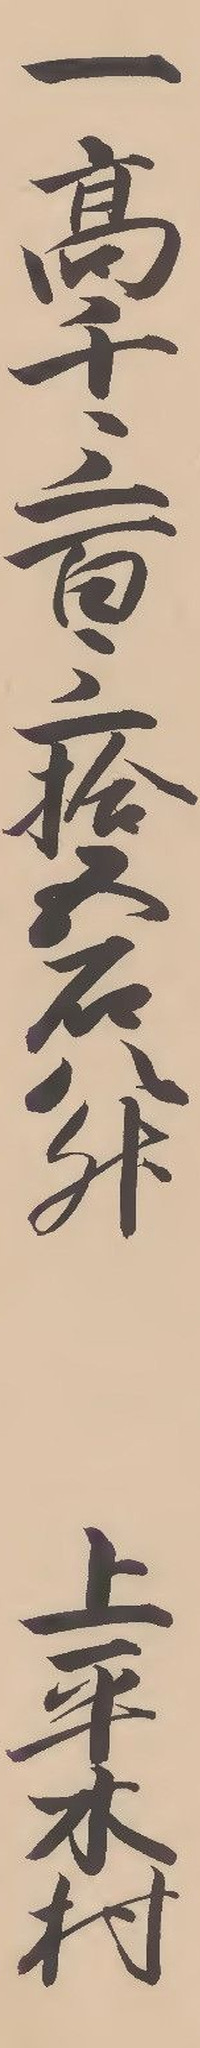一高千三百三拾五石八升上平木村

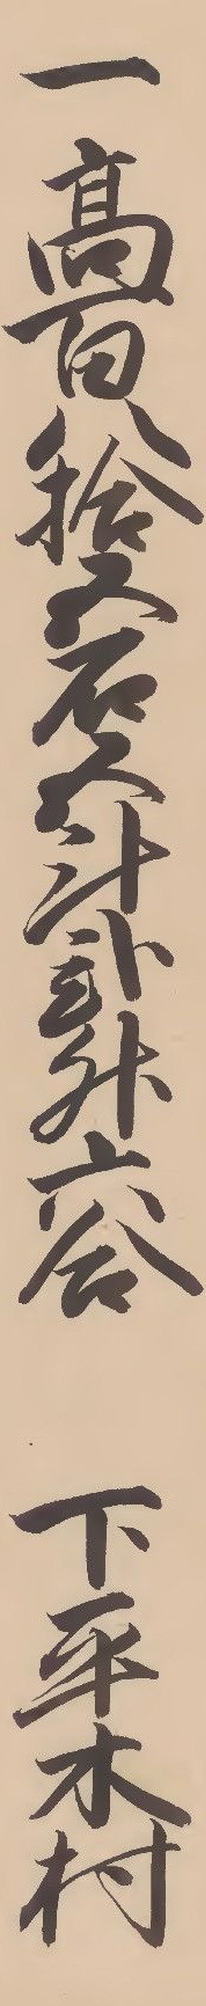一高百八拾五石五斗弐升六合下平木村
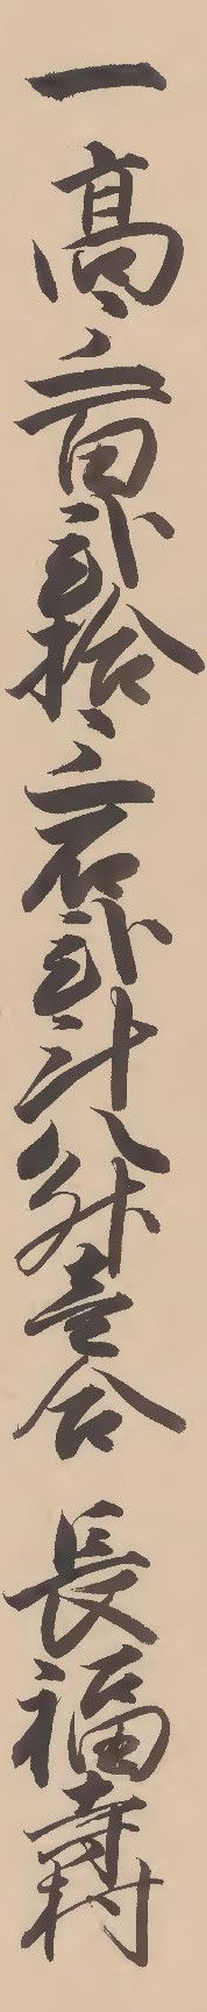一高三百弐拾三石弐斗八升壱合長福寺村
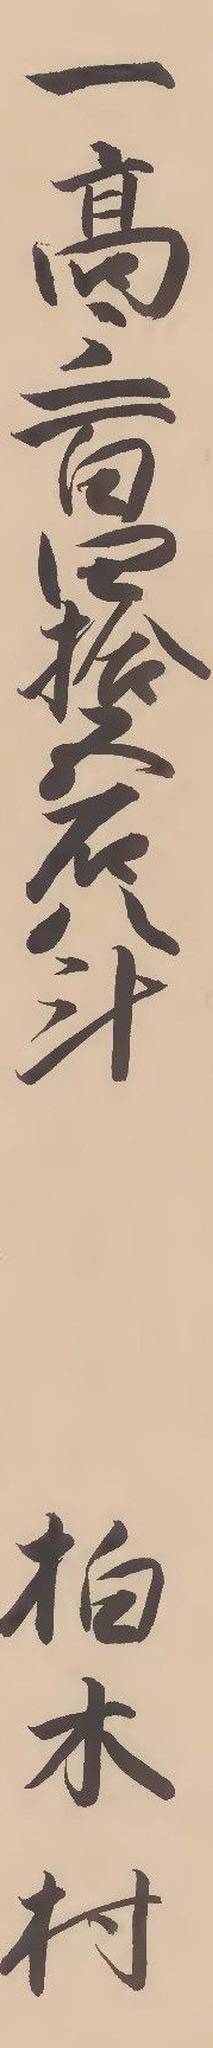一高三百四拾五石八斗柏木村
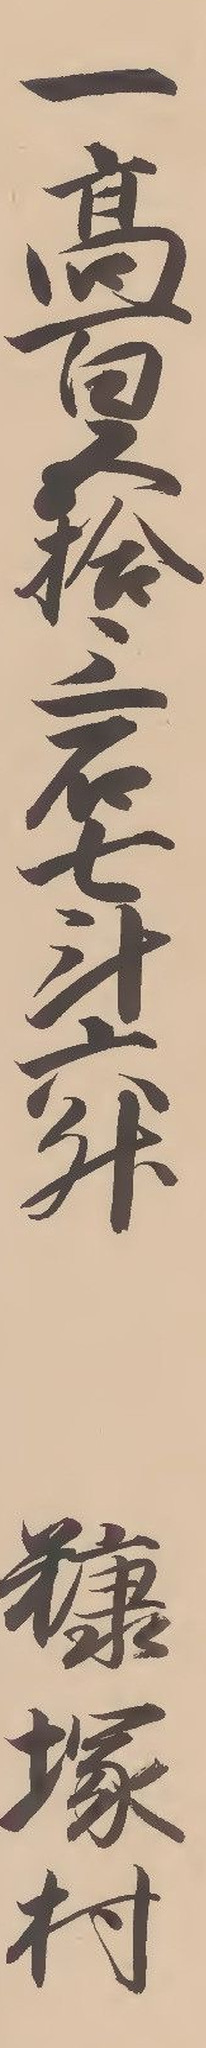一高百五拾三石七斗六升糠塚村
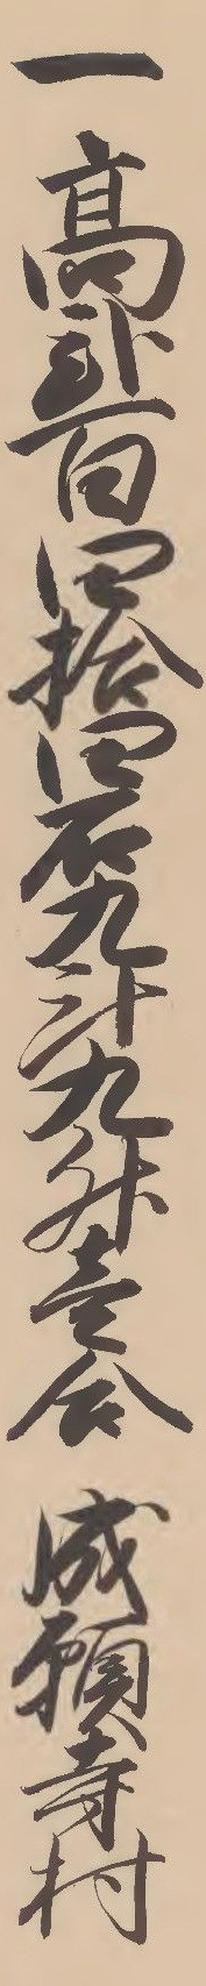一高弐百四拾四石九斗九升壱合成願寺村
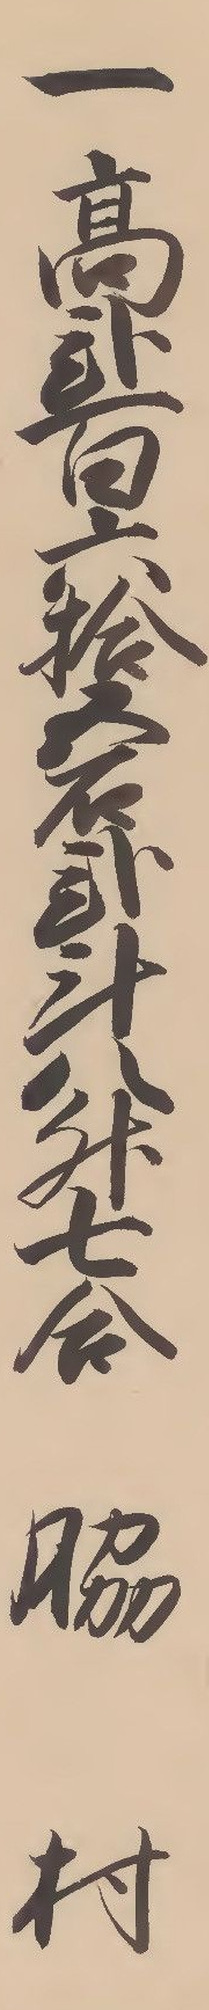一高弐百六拾五石弐斗八升七合脇村
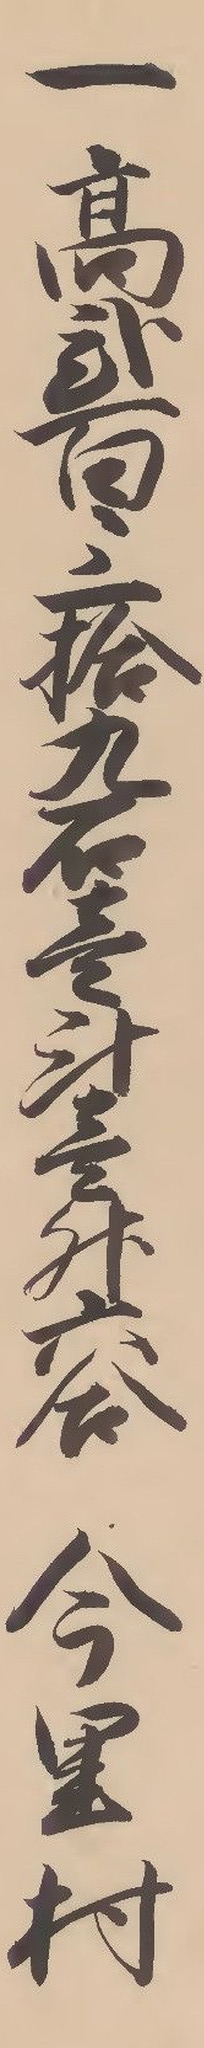一高弐百三拾九石壱斗壱升六合今里村

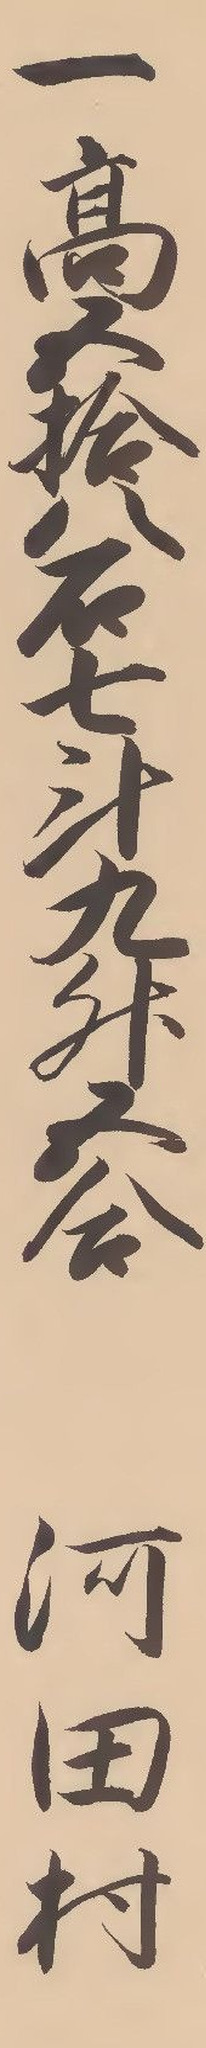一高五拾八石七斗九升五合河田村
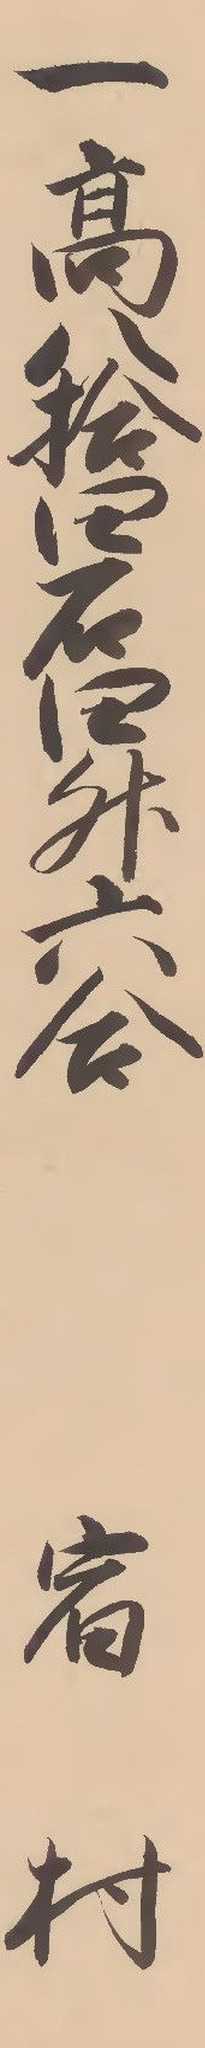一高八拾四石四升六合宿村
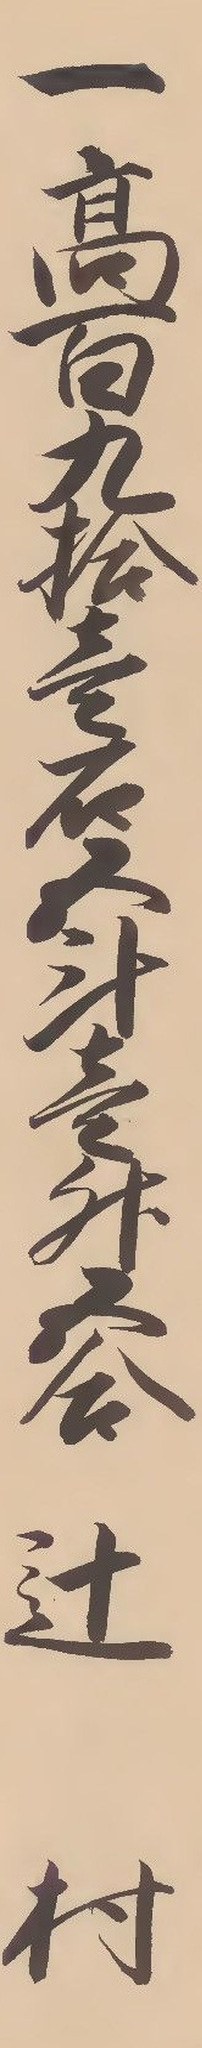一高百九拾壱石五斗壱升五合辻村
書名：近江国郷帳
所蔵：国立公文書館 National Archives of Japan
